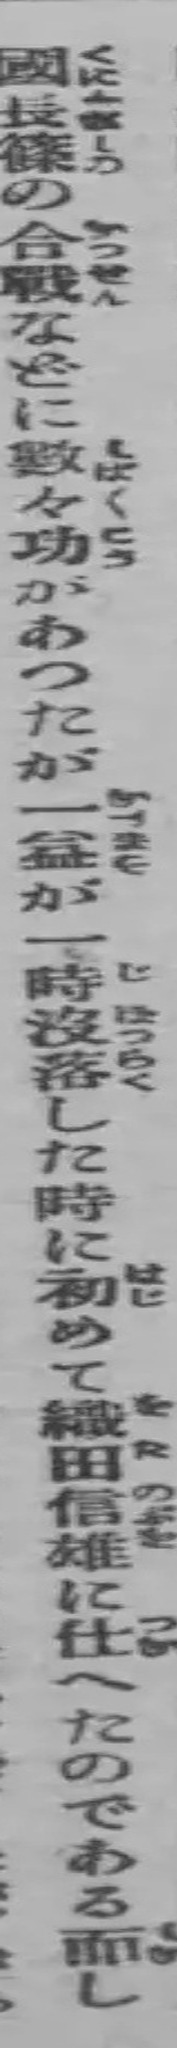国長篠の合戦などに数々功があつたが一益が一時没落した時に初めて織田信雄に仕へたのである而し
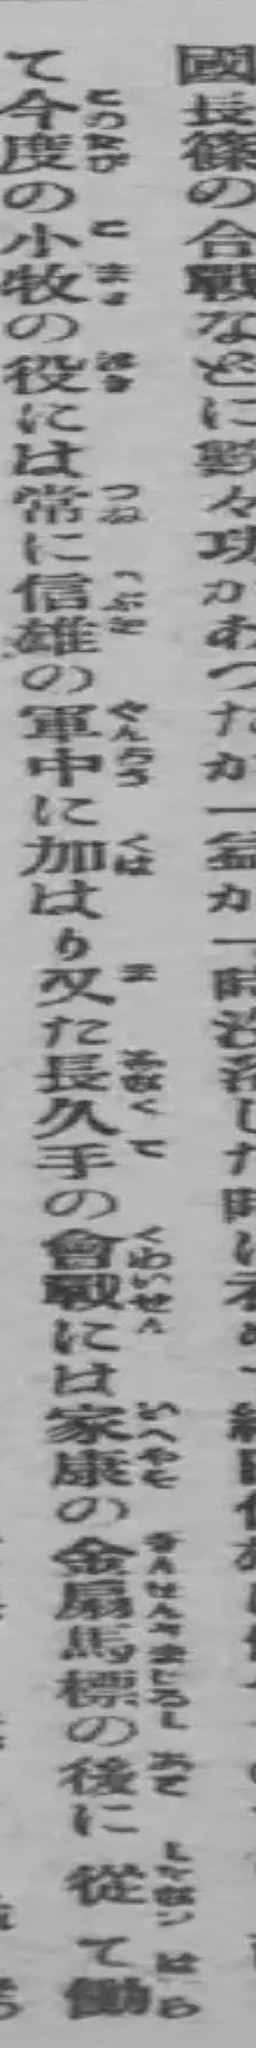て今度の小牧の役には常に信雄の軍中に加はり又た長久手の会戦には家康の金扇馬標の後に従て働
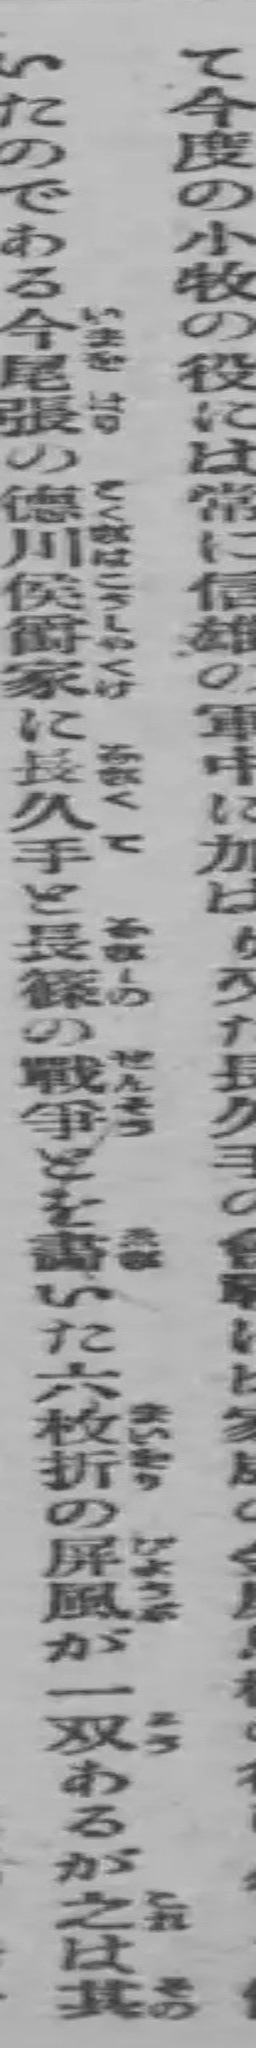いたのである今尾張の徳川侯爵家に長久手と長篠の戦争とを画いた六枚折の屏風が一双あるが之は其
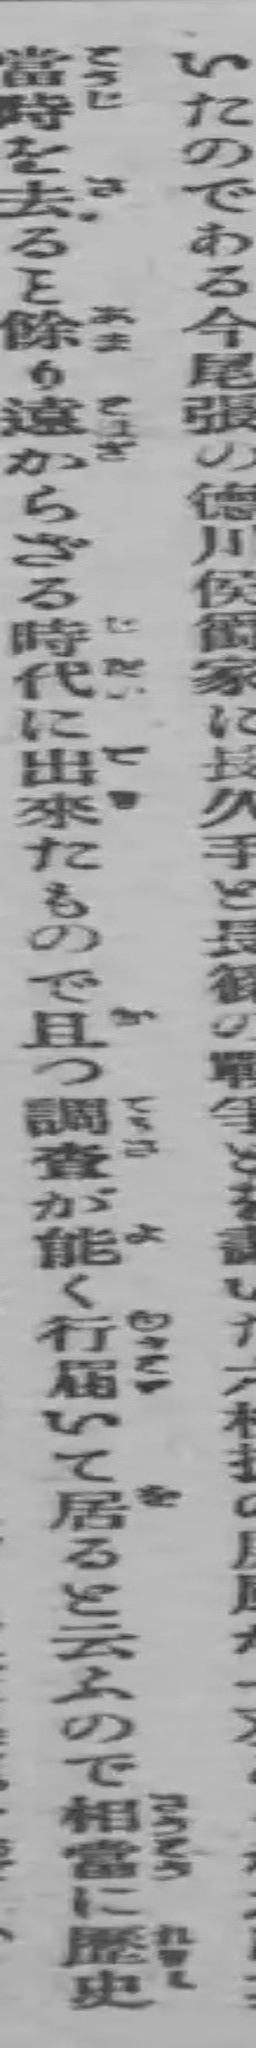当時を去ること余り遠からざる時代に出来たもので且つ調査が能く行届いて居ると云ふので相当に歴史
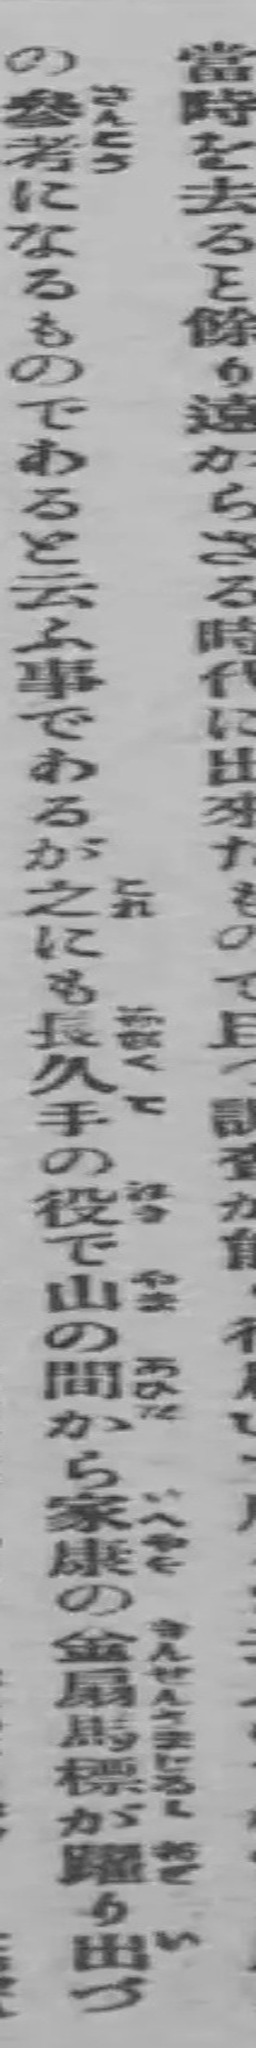の参考になるものであると云ふ事であるが之にも長久手の役で山の間から家康の金扇馬標が躍り出づ
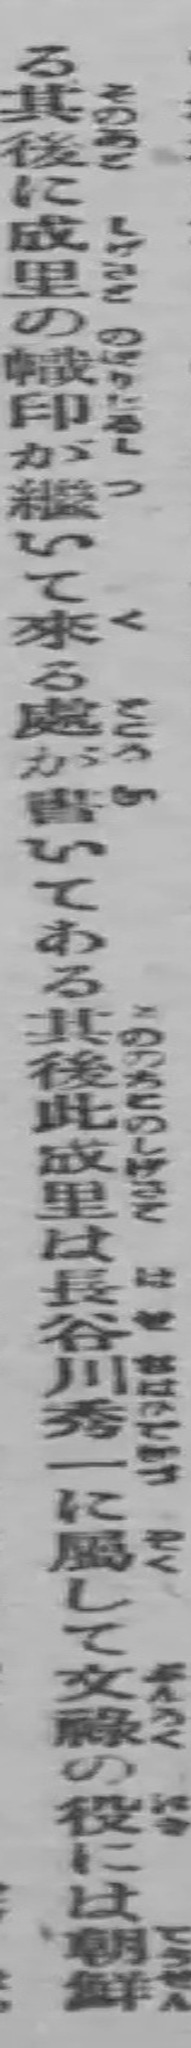る其後に成里の幟印が継いて来る処が書いてある其後此成里は長谷川秀一に属して文禄の役には朝鮮
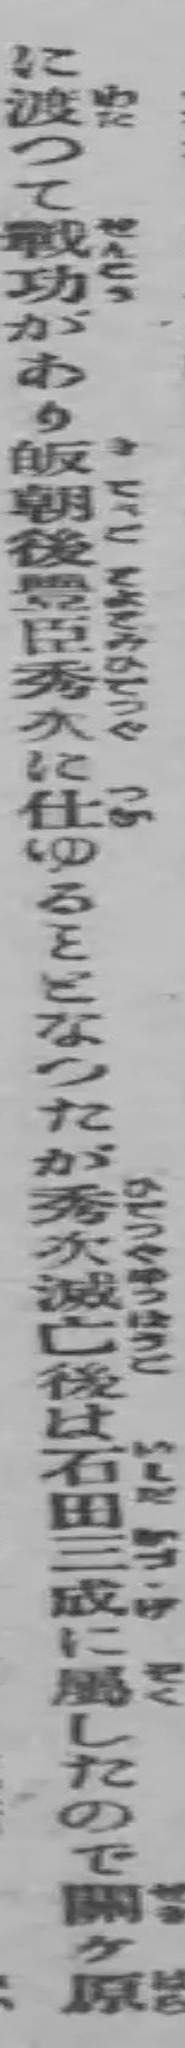に渡つて戦功があり皈朝後豊臣秀次に仕ゆることとなつたが秀次滅亡後は石田三成に属したので関ケ原
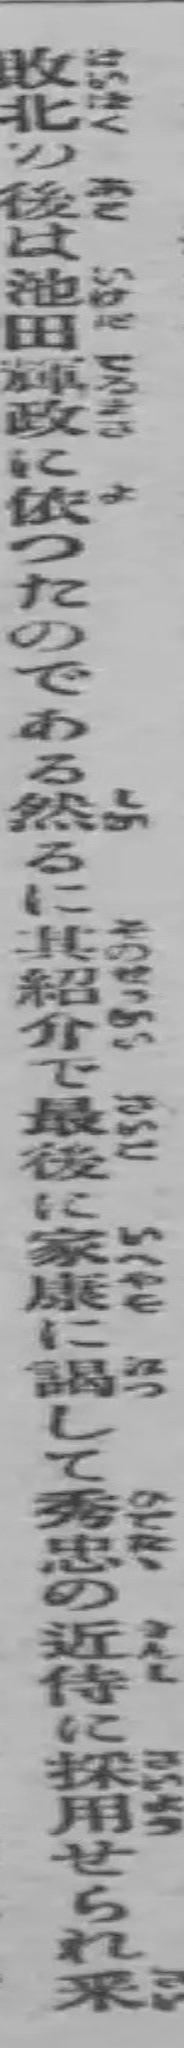敗北の後は池田輝政に依つたのである然るに其紹介で最後に家康に謁して秀忠の近侍に採用せられ釆
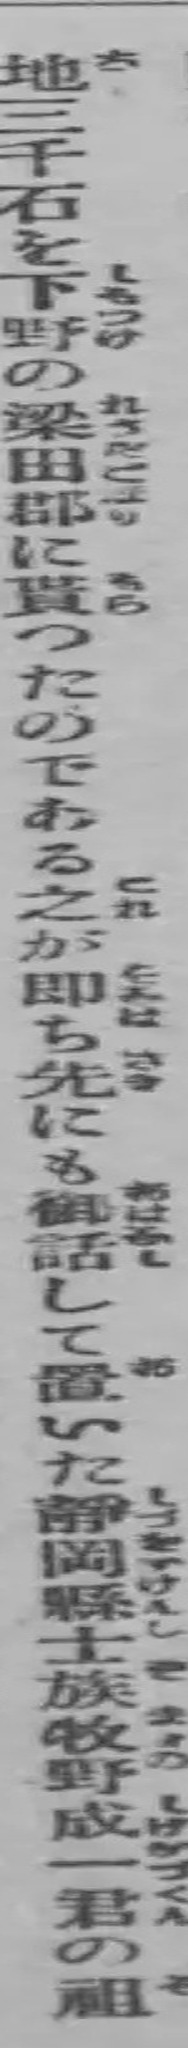地三千石を下野市の梁田郡に貰つたのである之が即ち先にも御話して置いた静岡県士族牧野成一君の祖
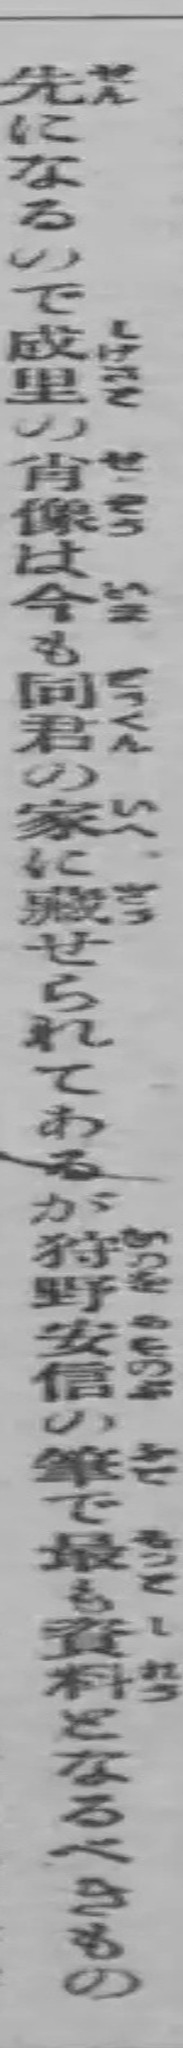先になるので成里の肖像は今も同君の家に蔵せられてあるが狩野安信の筆で最も資料となるべきもの
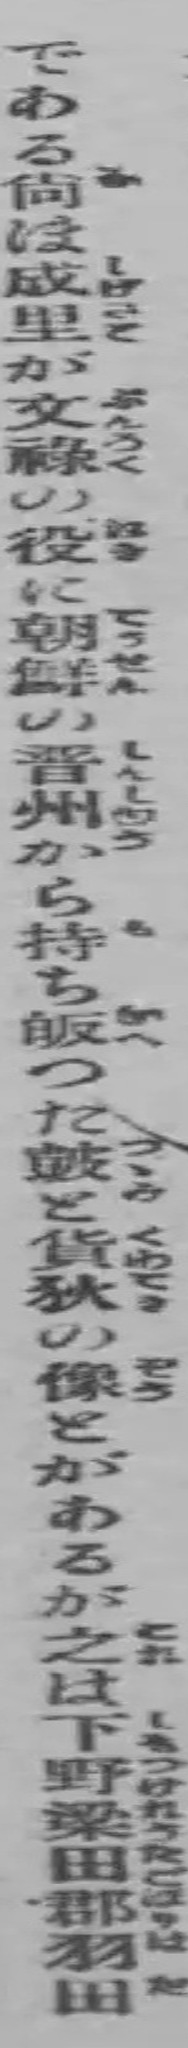である尚ほ成里が文禄の役に朝鮮の晋州から持ち皈つた鼓と貨狄の像とがあるが之は下野梁田郡羽田
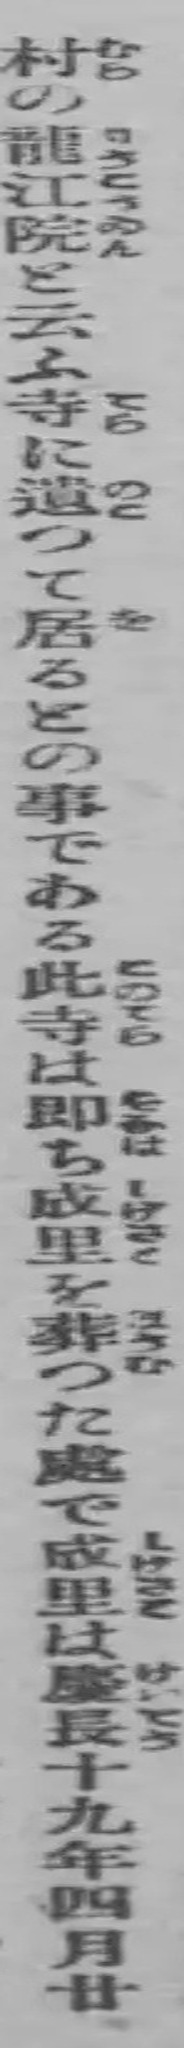村の龍江院と云ふ寺に遺つて居るとの事である此寺は即ち成里を葬つた処で成里は慶長十九年四月廿
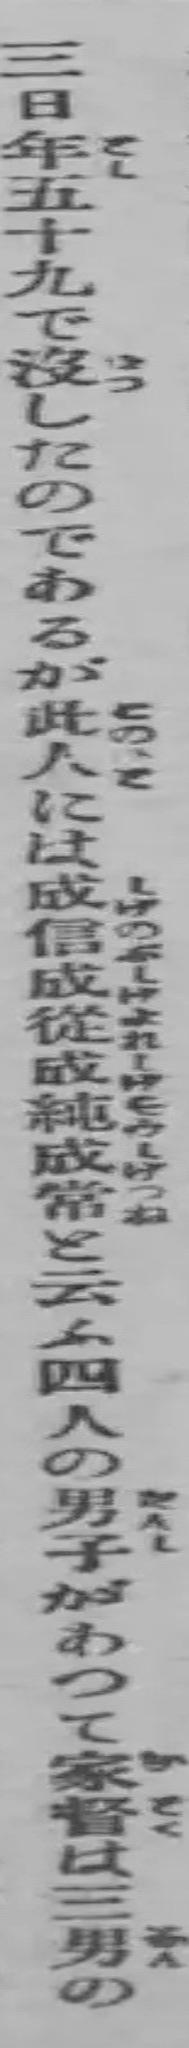三日年五十九で没したのであるが此人には成信成従成純成常と云ふ四人の男子があつて家督は三男の
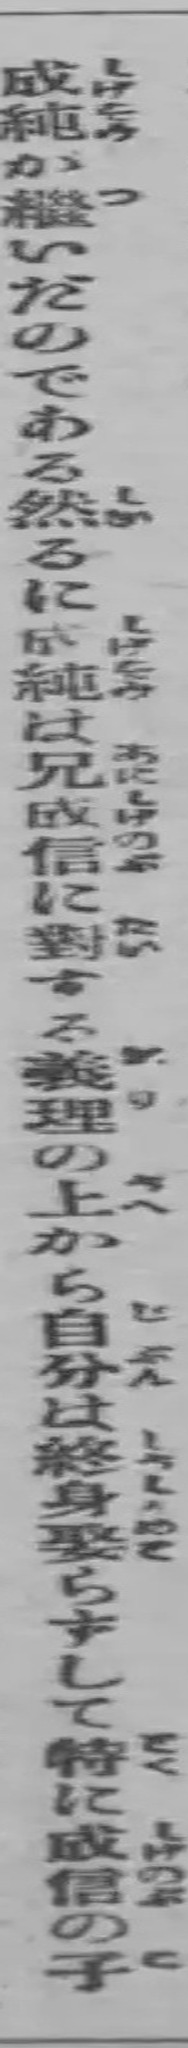成純が継いだのである然るに成純は兄成信に対する義理の上から自分は終身娶らずして特に成信の子
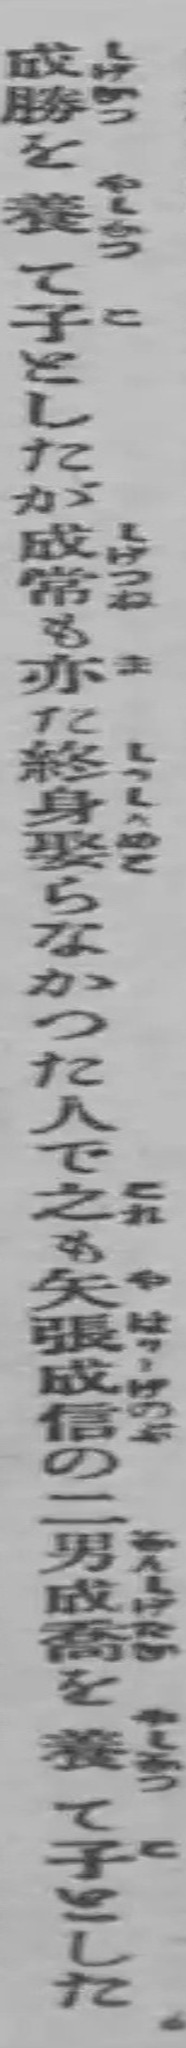成勝を養て子としたが成常も亦た終身娶らなかつた人で之も矢張成信の二男成喬を養て子とした
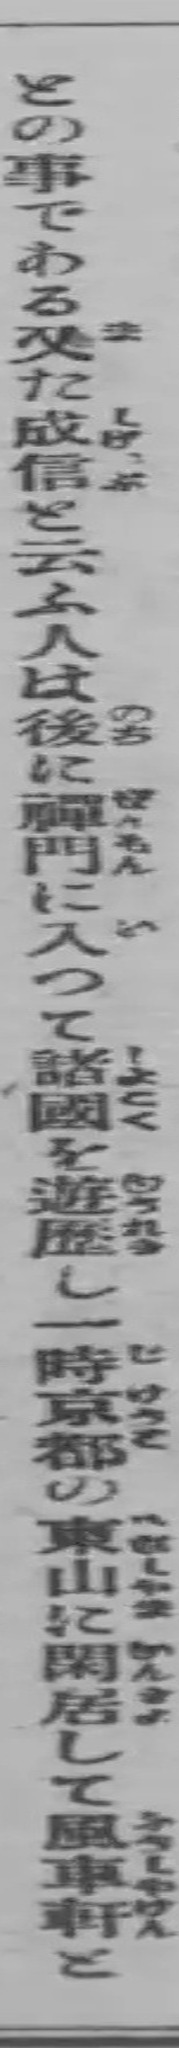との事である又た成信と云ふ人は後に禅門に入つて諸国を遊歴し一時京都の東山に閑居して風車軒と
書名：豊橋市史談
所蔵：国立国会図書館 National Diet Library, JAPAN
